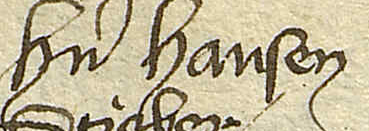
hn* hanſen
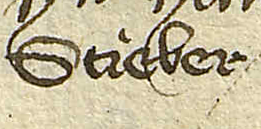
Stieber /
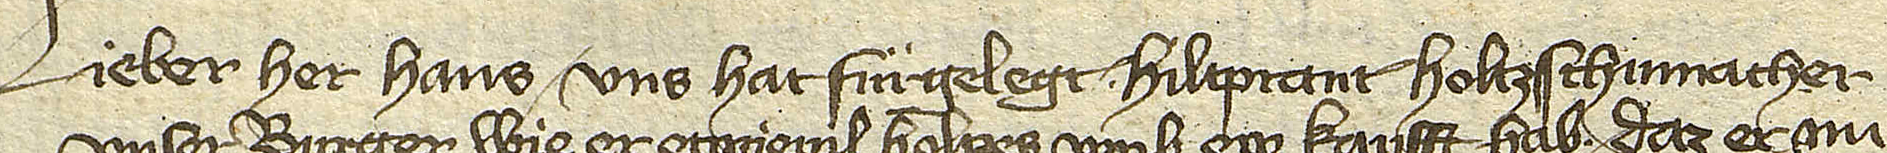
Lieber her hans / vns hat fürgelegt / . hiltprant holcʒſchumacher
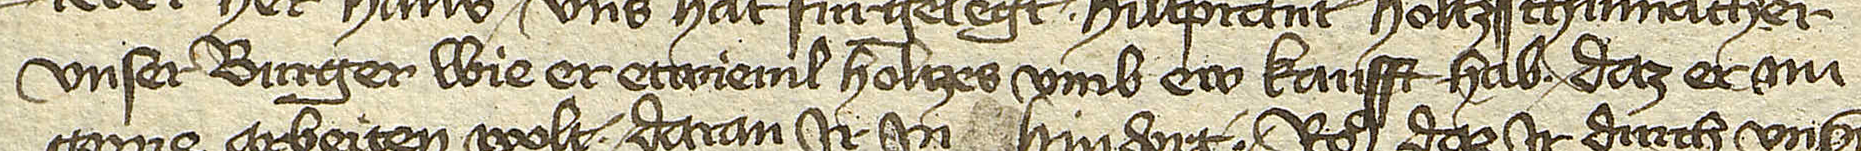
vnſer Burger wie er etwieuil holcʒes vmb ew kaufft hab . / daʒ er nu
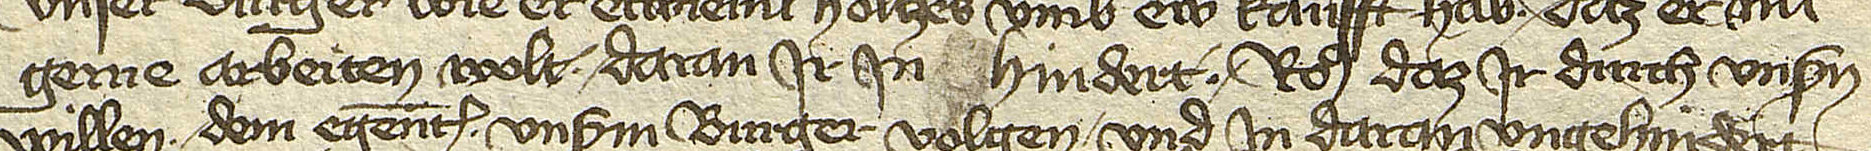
gerne arbeiten wolt . / daran Ir In hindert . / Ro* daʒ Ir durch vnſ*n
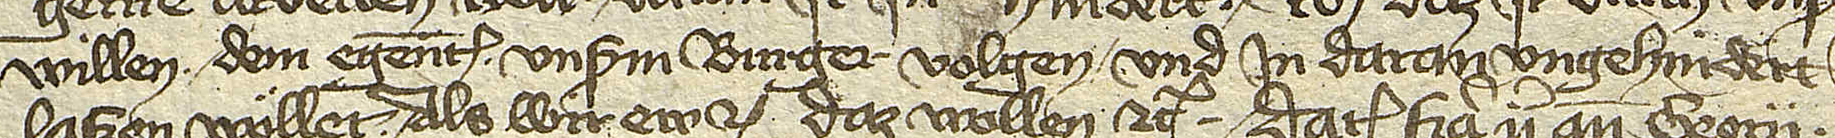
willen . / dem egen*t* vnſ*m Burger volgen / vnd In daran vngehindert
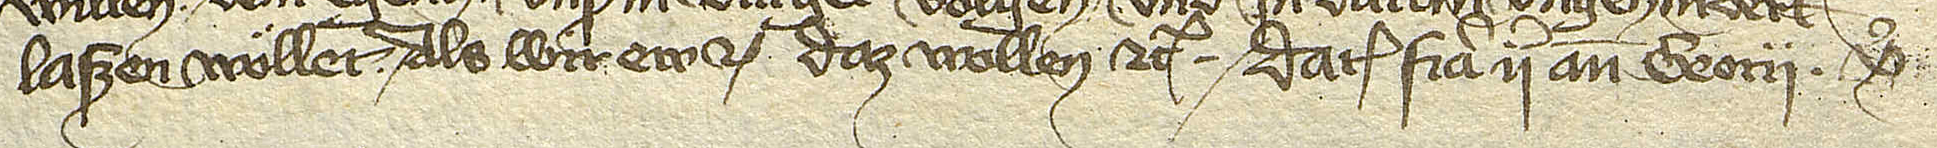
laſʒen wöllet . / Als wir ew ec* daʒ wollen ec* - / Dat* fia* ii* an* Georii . x*
